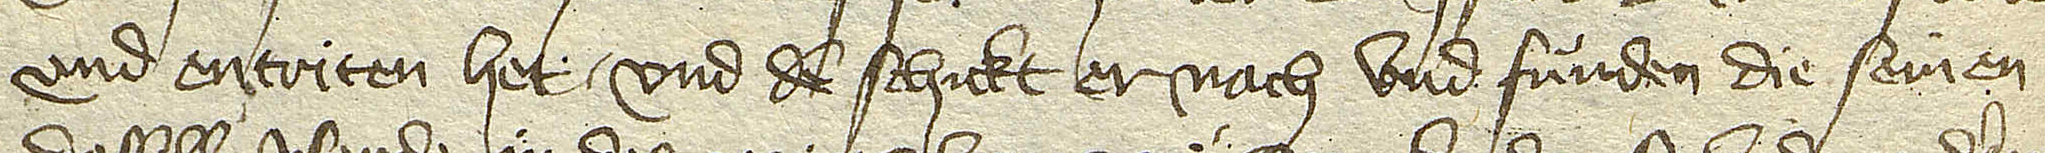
vnd entriten het / vnd d* ſchickt er nach vnd fünden die ſeinen
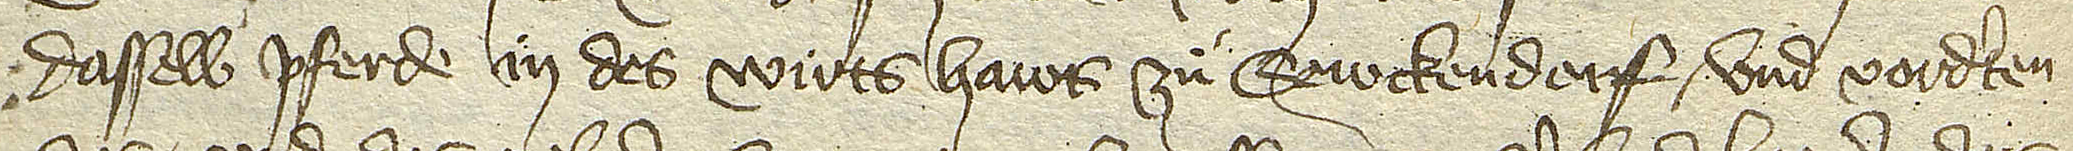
daſſelb pferde in des wirts haws cʒü Sewckendorf / vnd vord*ten
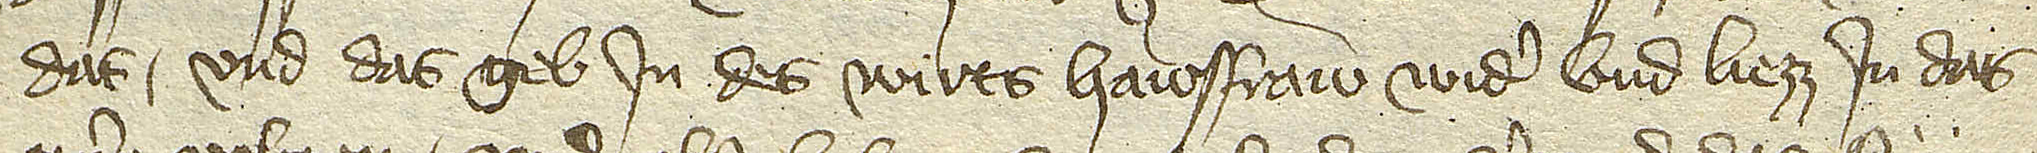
das / vnd das geb In des wirts hawſfraw wid* vnd lieʒʒ In das
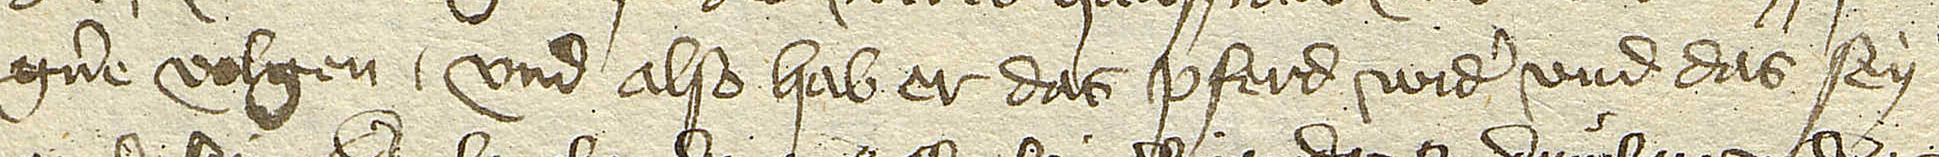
gn*e volgen / vnd alſo hab er das pferd wid* vnd das ſey
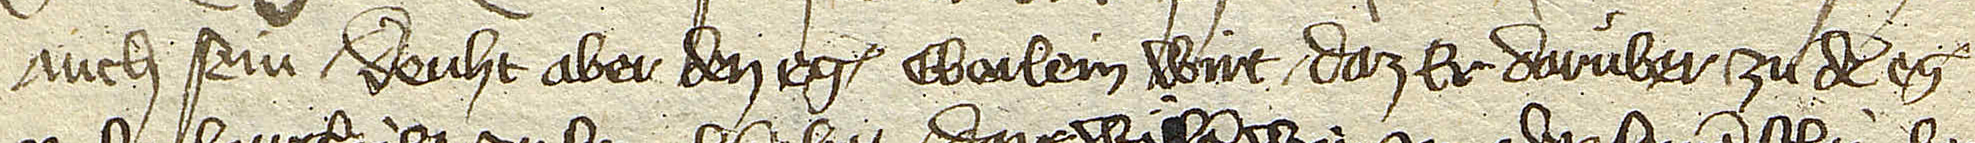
auch ſein / Deuht aber den eg* Eberlein wirt / daʒ Er darüber cʒu d* eg*
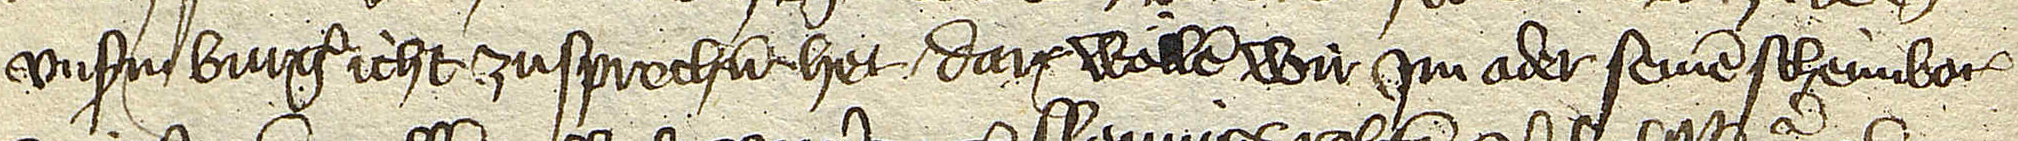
vnſ*m burg* icht cʒuſprechn* het / dar* wölle* wir Im oder ſeine* ſcheimbot*
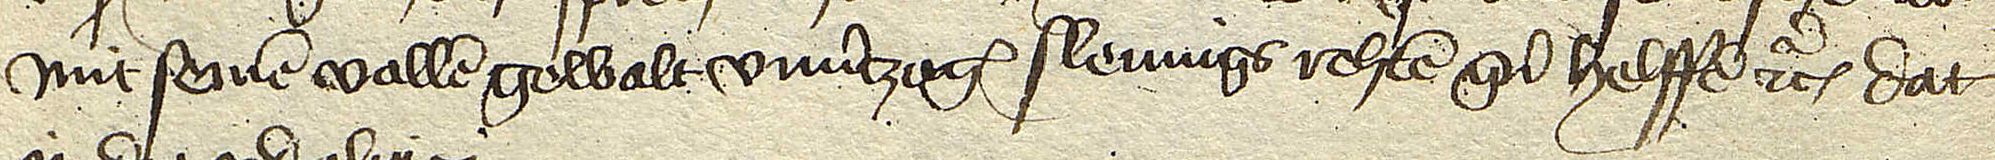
mit ſeine* volle* gewalt vnu*cʒog* ſlewnigs rehte* gn* helffe* ec* dat*
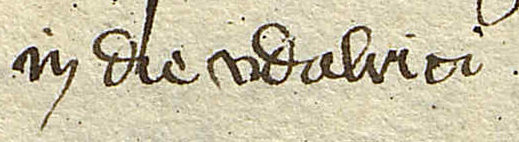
in die vdalrici
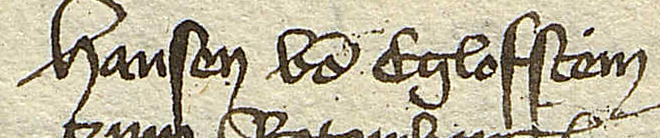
hanſen vo* Eglofſtein
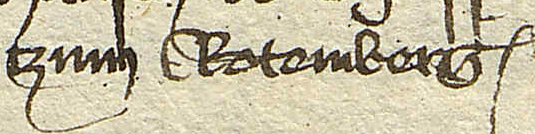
cʒum Rotemberg
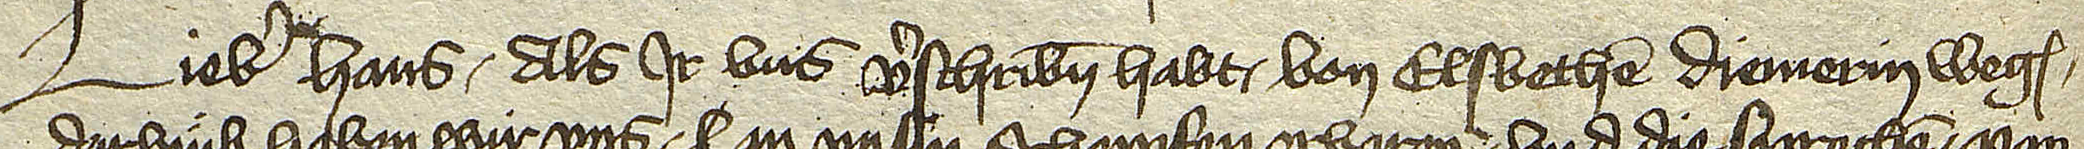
Lieb* hans / Als Ir vns v*ſchribn* habt / von Elſbethe* dienerin weg*
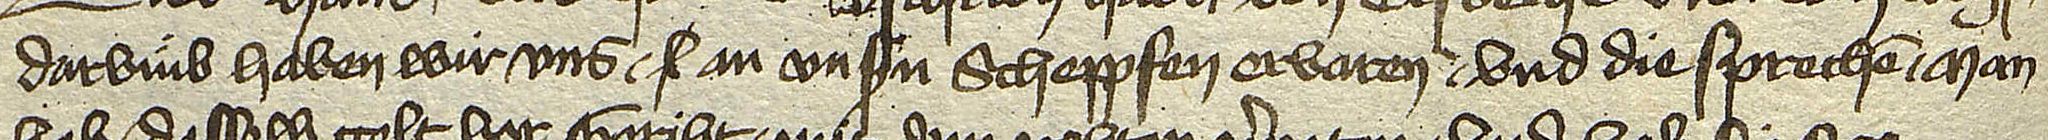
darv̈mb haben wir vns / % an vnſ*n Scheppfen ervaren / vnd die ſpreche* / Man
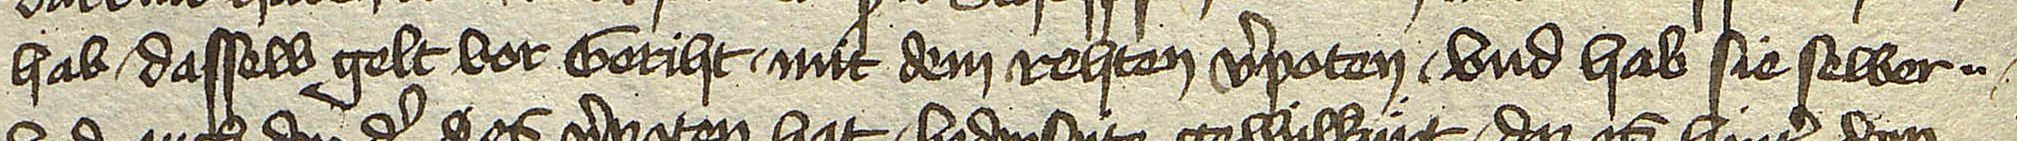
hab / daſſelb gelt vor Geriht / mit dem rehten v*poten / vnd hab ſie ſelber ~ /
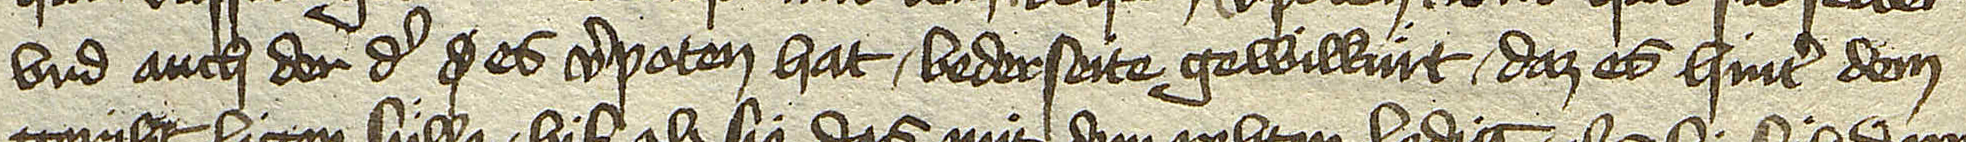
vnd auch der d* d es v*poten hat / bederſeite gewilkürt / daʒ es hint* dem
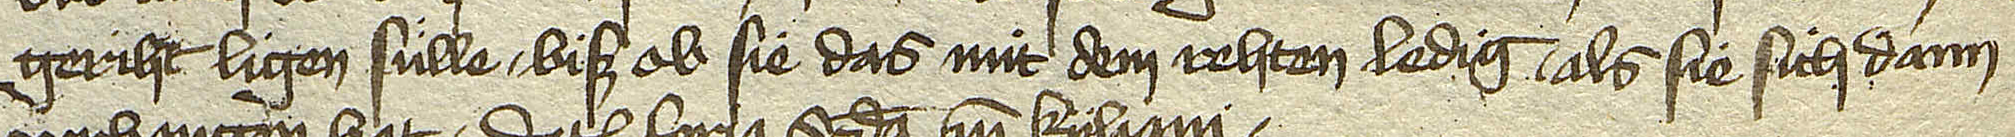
geriht ligen ſülle / biſʒ ob ſie das mit dem rehten ledig / als ſie ſich dann
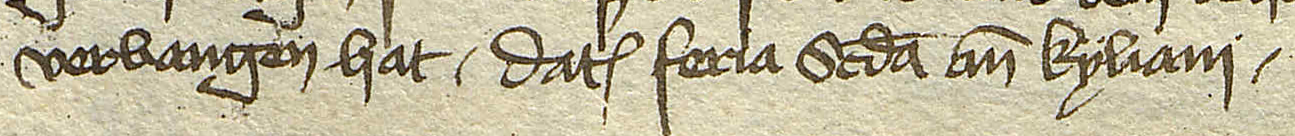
vervangen hat / dat* feria Scda* an* kyliani /
